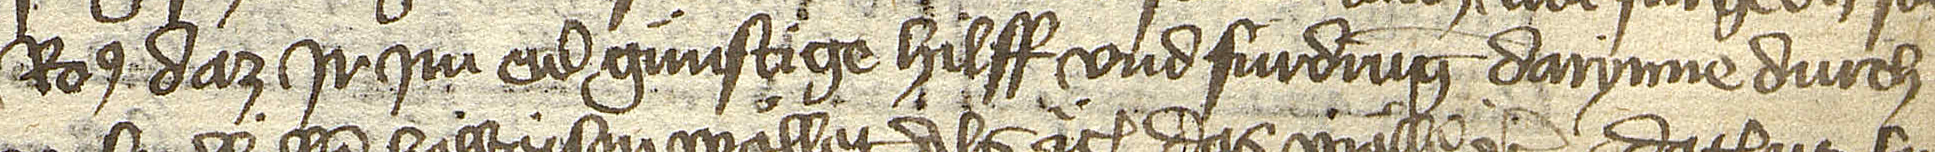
Ro* daʒ Ir Im ew* günſtige hilff vnd fürdrug* darynne durch
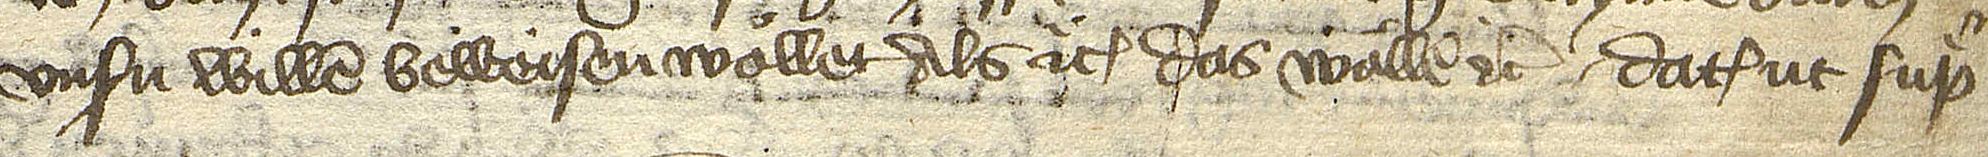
vnſ*n wille* beweiſen wöllet Als ec* das wölle* ec* / dat* ut ſup*
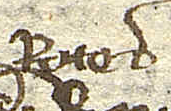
Rate* ec*
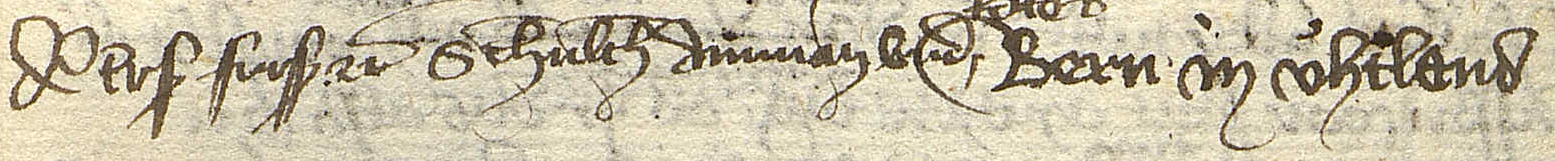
D* Erſ* furſ* ec* Schulth* Amman* vnd / Bern in v̈htland
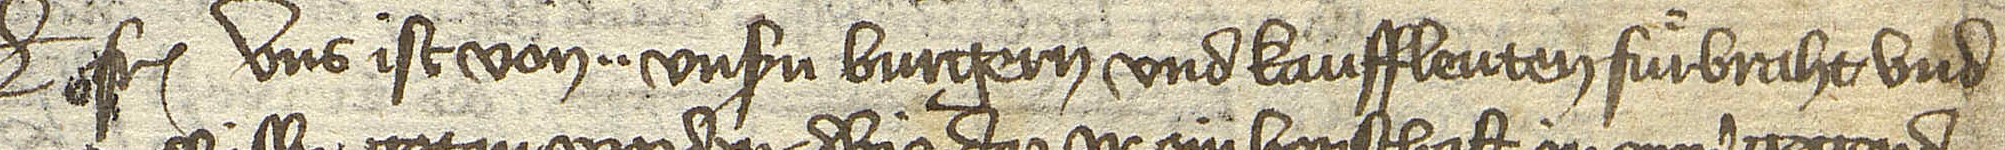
L* fr* Vns iſt von ~ vnſ*n burgern vnd kauffleuten fürbraht / vnd
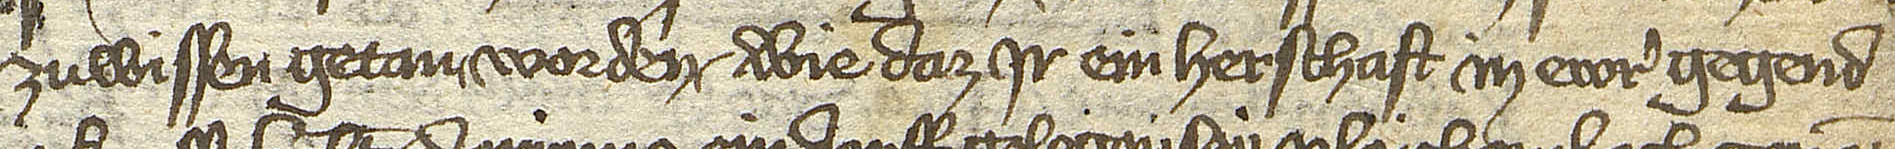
cʒuwiſſen getan / worden / wie daʒ Ir ein herſchaft in ewr* gegend
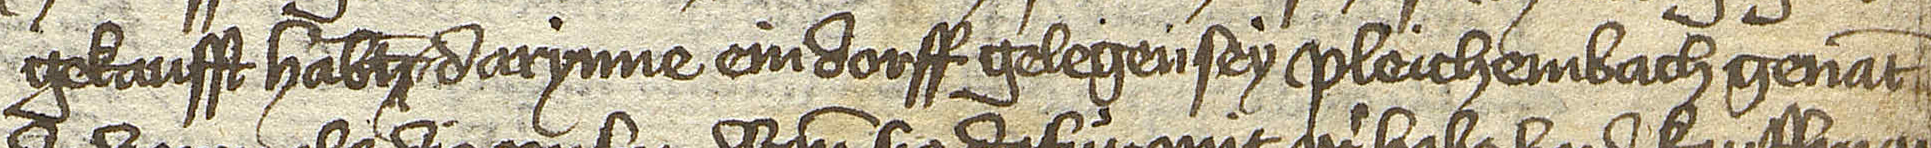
gekaufft habt / darynne ein dorff gelegen ſey Pleichembach genat*
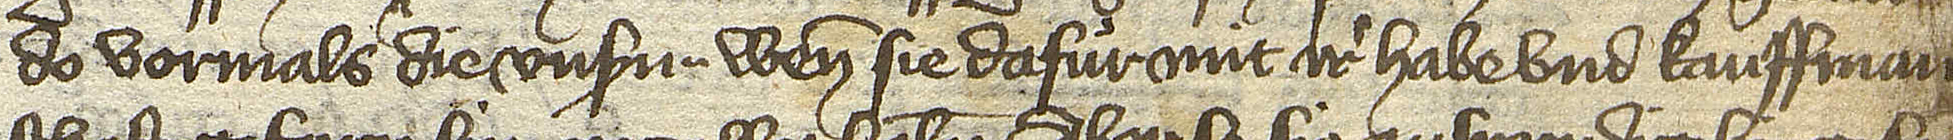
do vormals die vnſ*n ~ wen* ſie dafür mit ir* habe vnd kauffman -
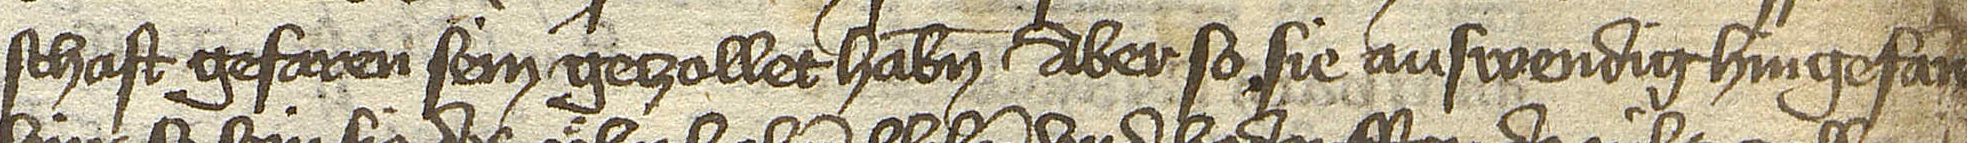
ſchaft gefaren ſein gecʒollet habn* / Aber ſo ſie auſwendig hingefaren
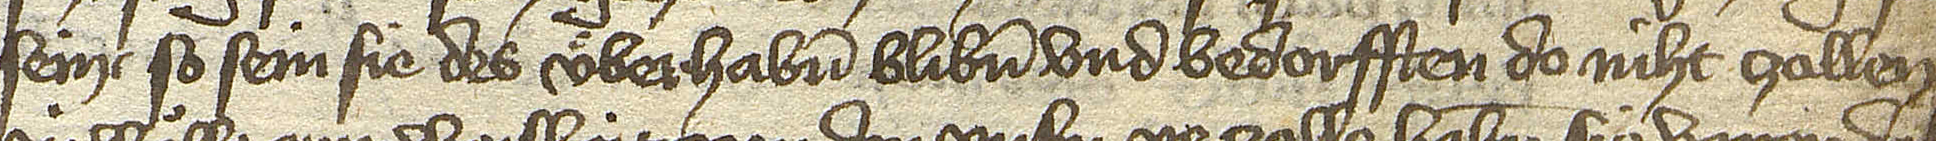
ſein / ſo ſein ſie des v̈berhabn* blibn* vnd bedorfften do niht cʒollen
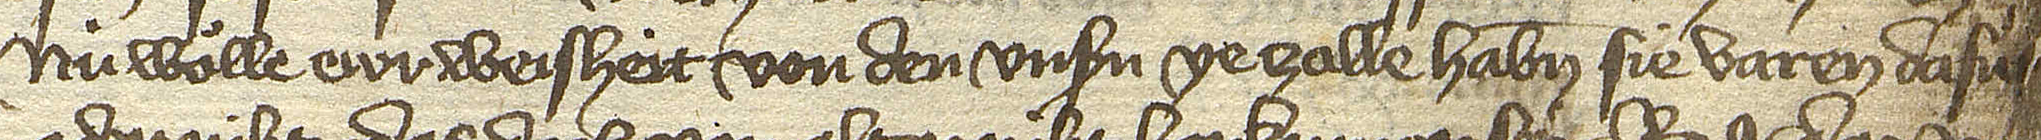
Nü wölle ewr weiſheit von den vnſ*n yecʒolle habn* ſie varen dafür
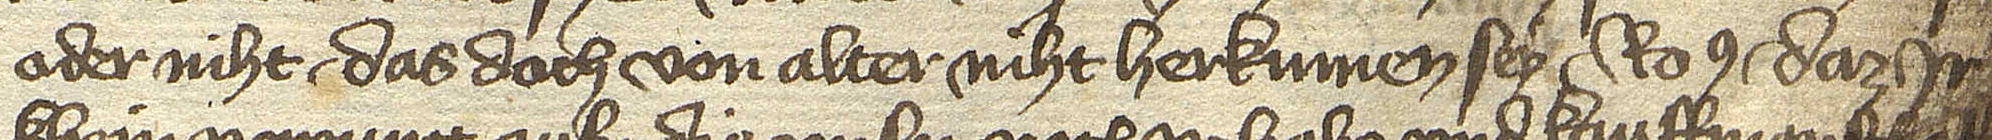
oder niht / das doch von alter niht herkumen ſey / Ro* / daʒ Ir
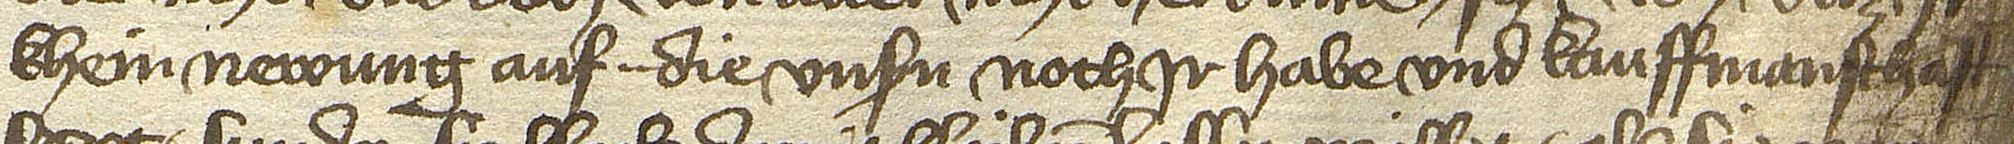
khein newung auf ~ die vnſ*n noch Ir habe vnd kauffmanſchaft
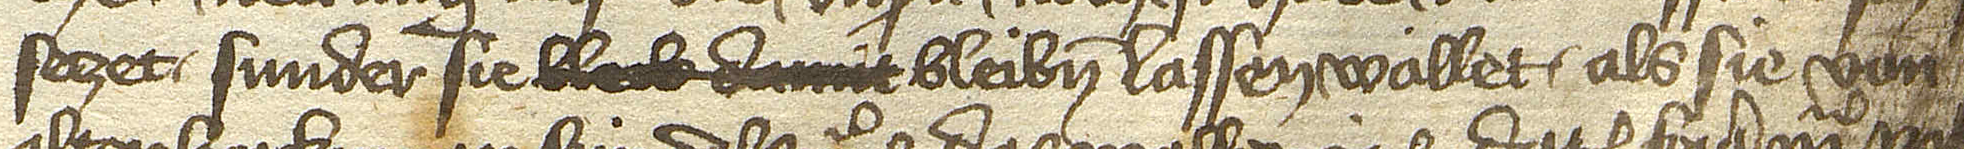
ſecʒet / ſunder ſie bleib damit bleibn* laſſen wöllet / als ſie von
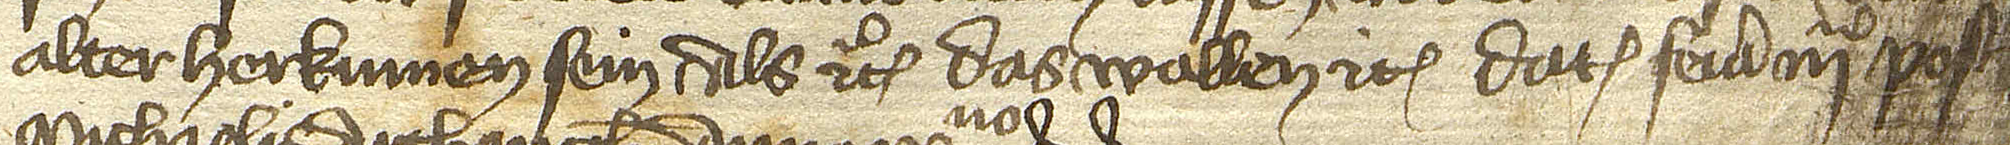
alter herkumen ſein / Als ec* das wollen ec* Dat* feia* iii* poſt
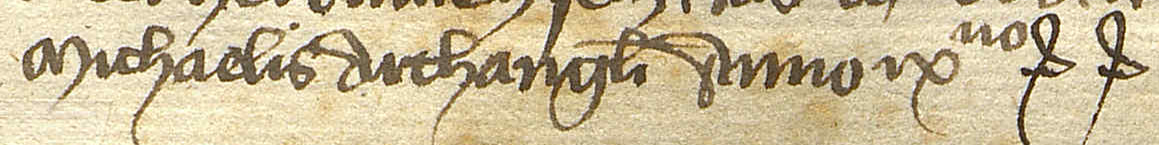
Michaelis Archangli* Anno ix* § §
